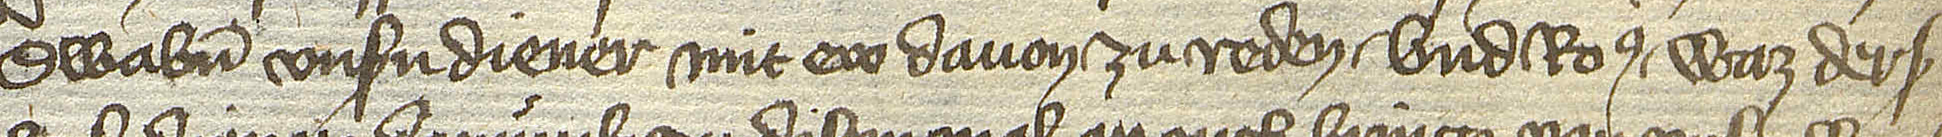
Swabn* vnſ*n diener mit ew dauon cʒu reden / vnd Ro* / waʒ derſ*
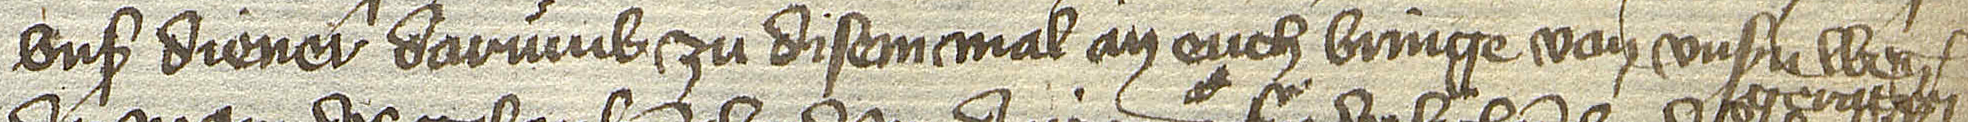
vnſ* diener darümb cʒu diſem mal an euch bringe von vnſ*n weg*
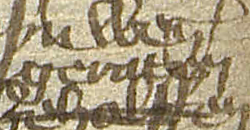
geraten
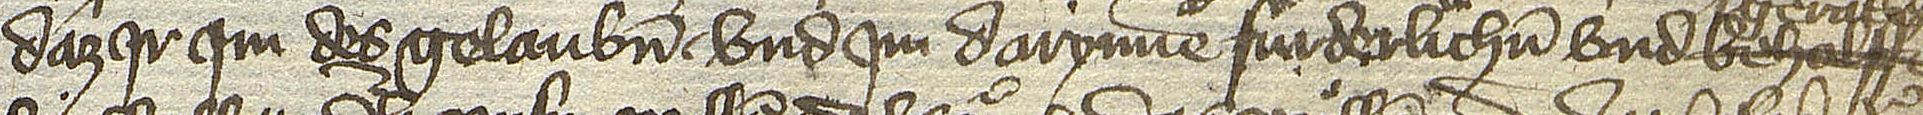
daʒ Ir Im des gelaubn* / vnd Im darynne fürderlichn* vnd beholffen
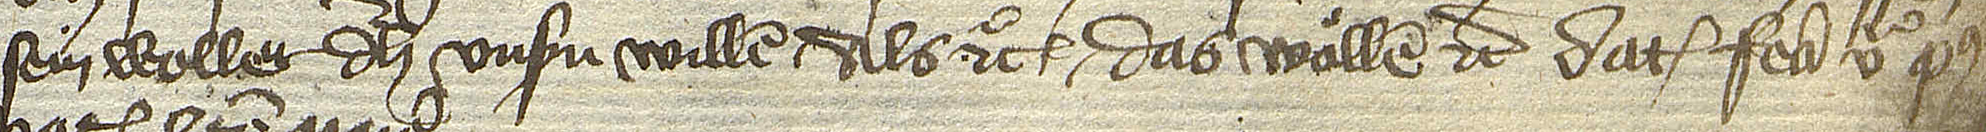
ſein wollet d*h vnſ*n wille* / Als ec* / das wölle* ec* Dat* fea* v* p*
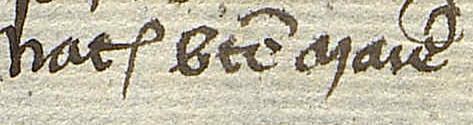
Nat* bte* Maie*
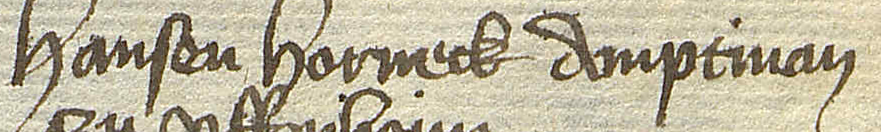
hanſen horneck Amptman
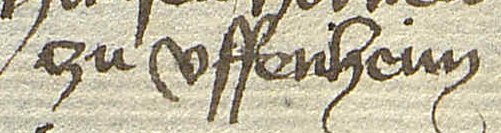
cʒu Vffenheim
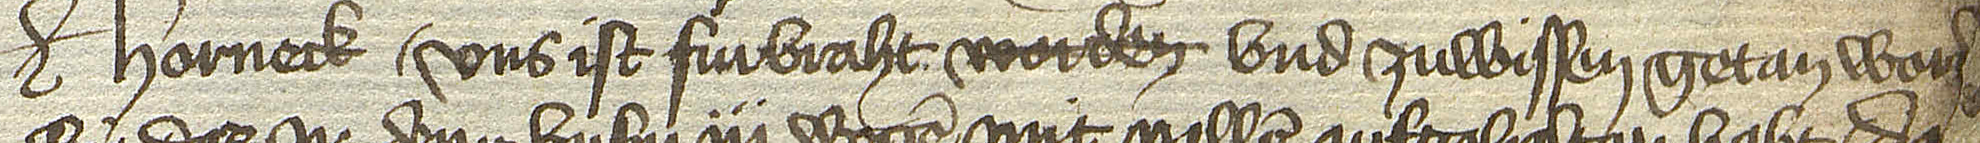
L* horneck / vns iſt fürbraht worden vnd cʒuwiſſen getan word
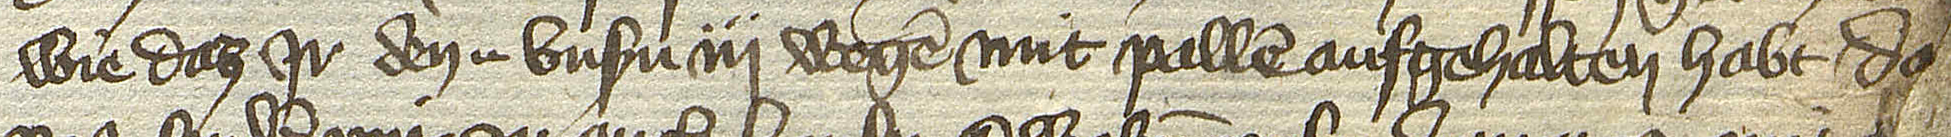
wie daʒ Ir den ~ vnſ*n iii wege* mit palle* aufgehalten habt / do
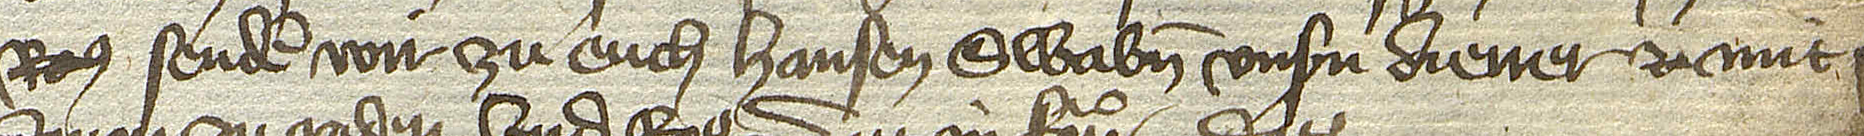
Ro* ſende* wir cʒu euch hanſen Swabn* vnſ*n diener % mit
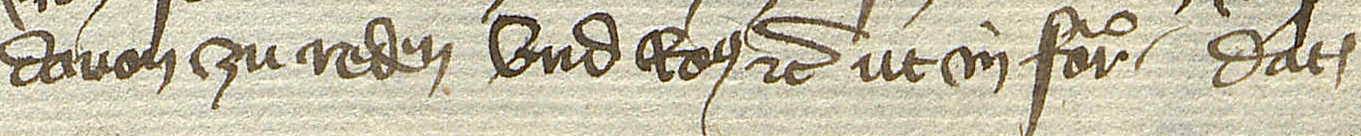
dauon cʒu reden vnd Ro* ec* ut in for* / dat*
